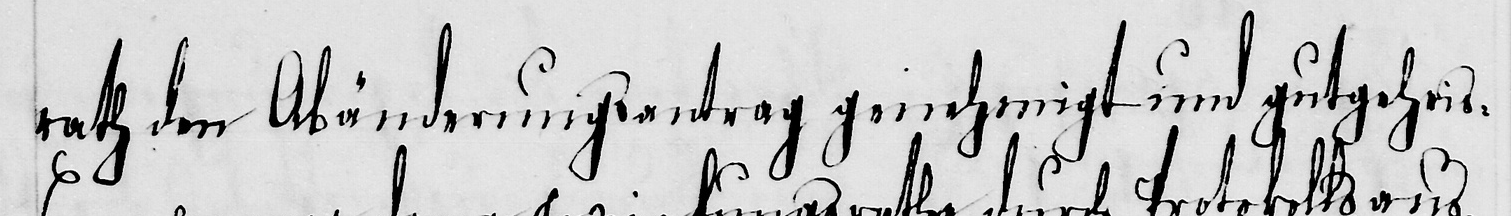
rath den Abänderungsantrag genehmigt und gutgeheiß¬
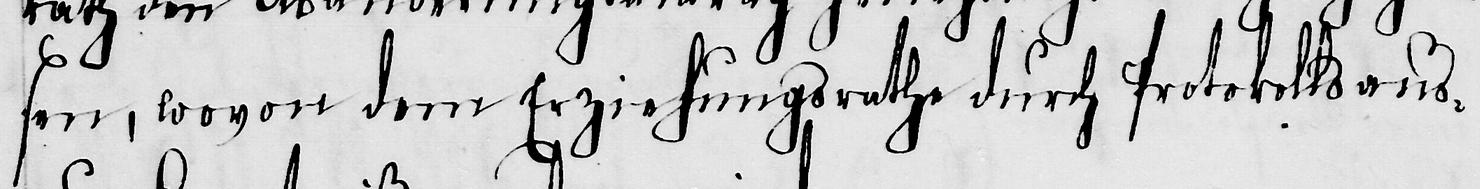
en, wovon dem Erziehungsrathe durch Protokollsaus¬
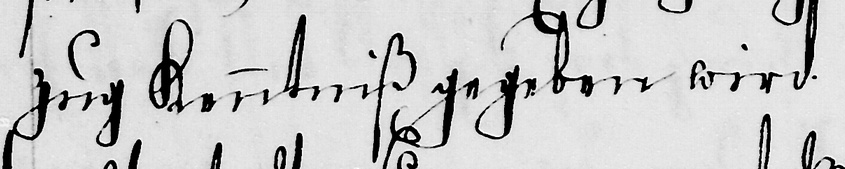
zug Kenntniß gegeben wird.
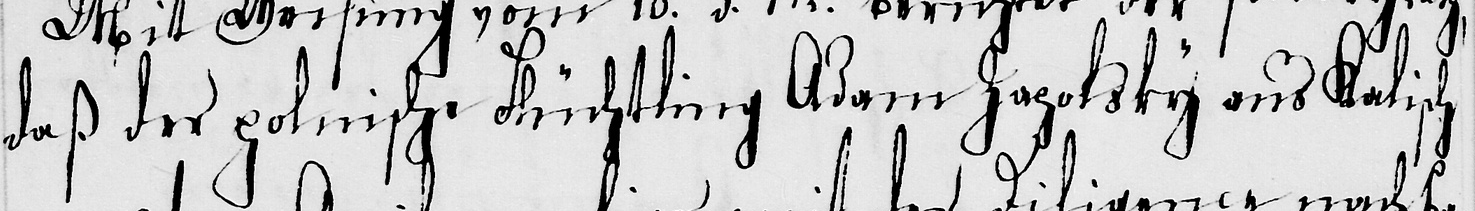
daß der polnische Flüchtling Adam Zapolsky aus Kalis¬
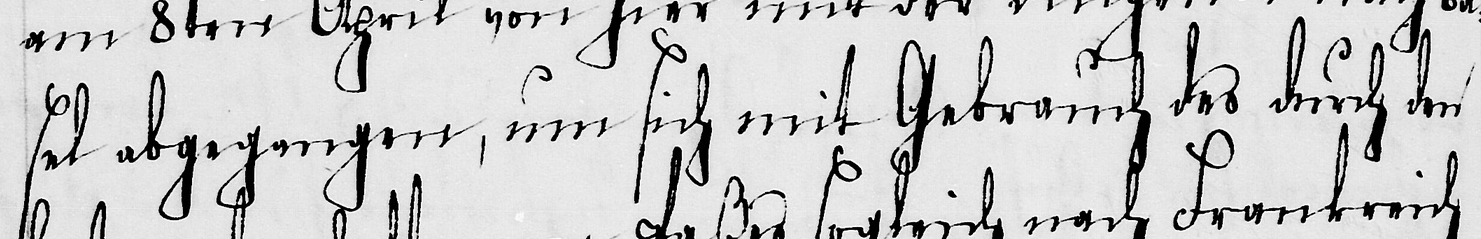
sel abgegangen, um sich mit Gebrauch des durch den
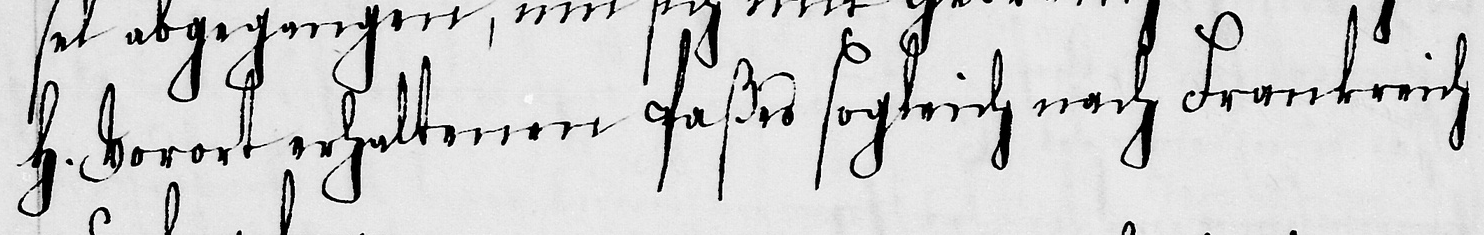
H. Vorort erhaltenen Paßes sogleich nach Frankreich
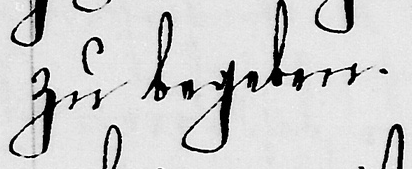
zu begeben.
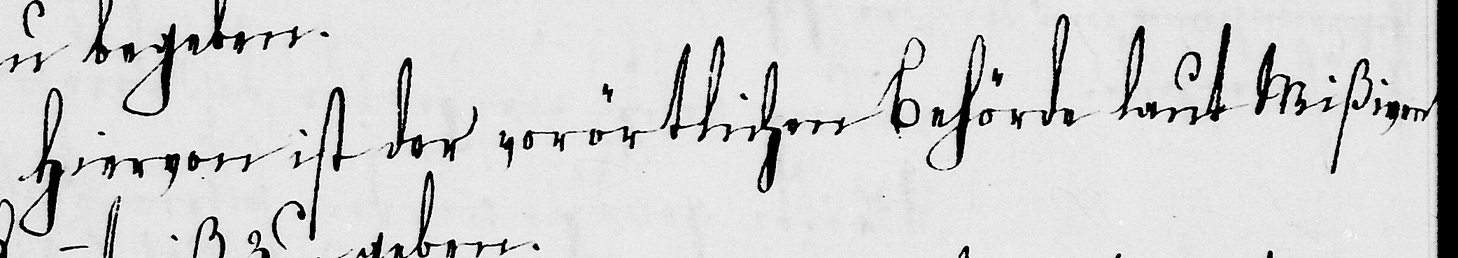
Hiervon ist der vorörtlichen Behörde laut Mißiven
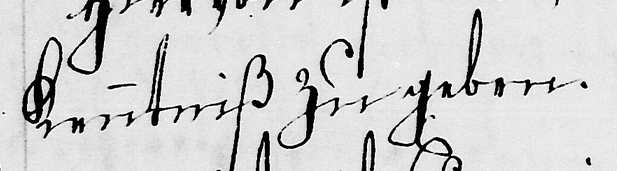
Kenntniß zu geben.
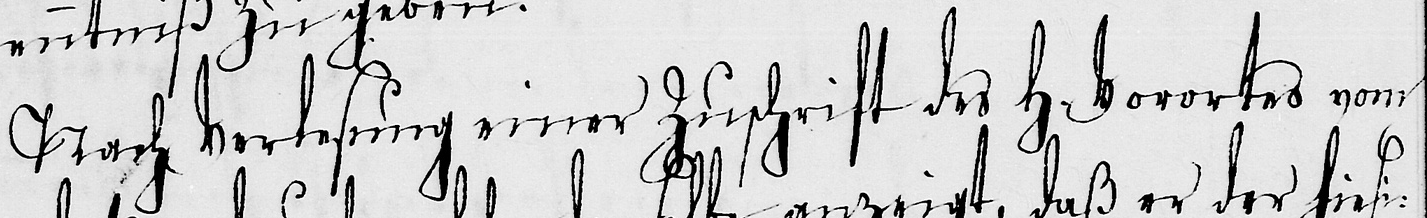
Nach Verlesung einer Zuschrift des H. Vorortes vom
